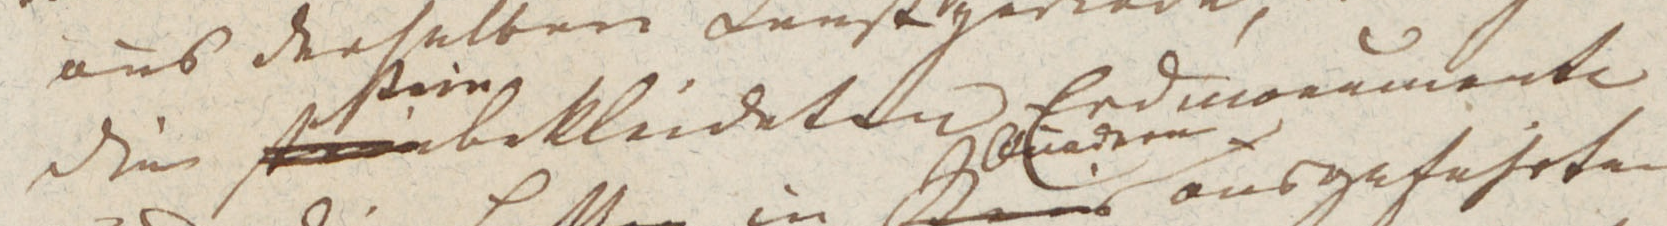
die steinsteinbekleideten Erdmonumente
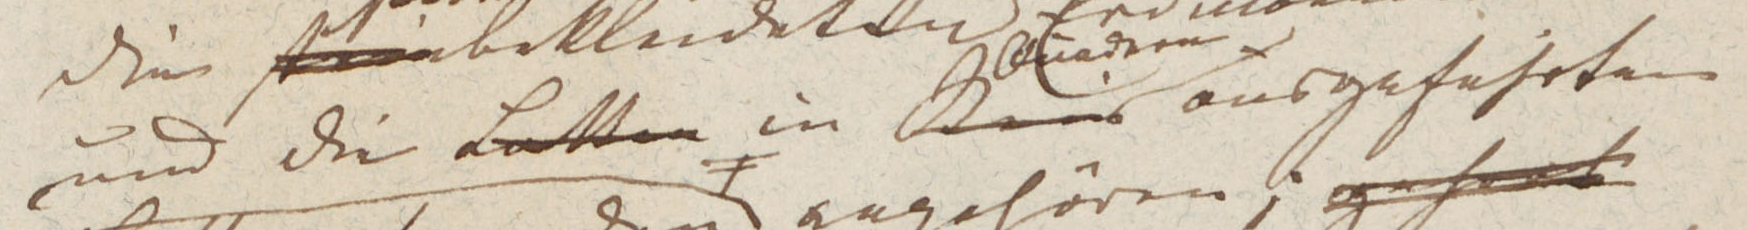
und die Latten in Stein Quadern ausgeführten
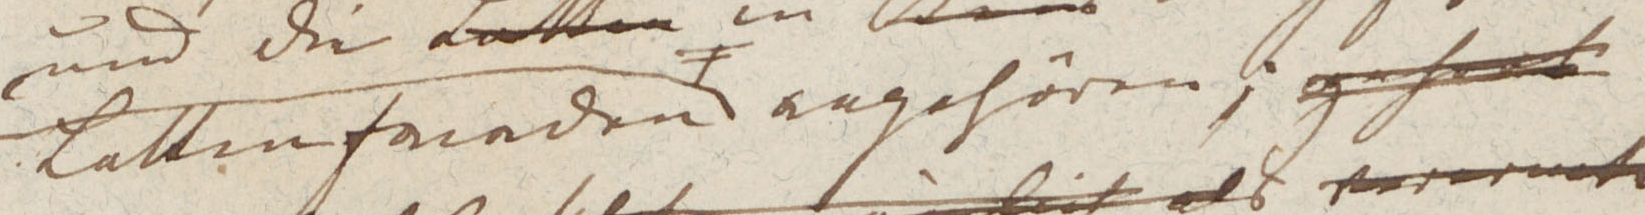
Lattenfacaden % angehören; gehort
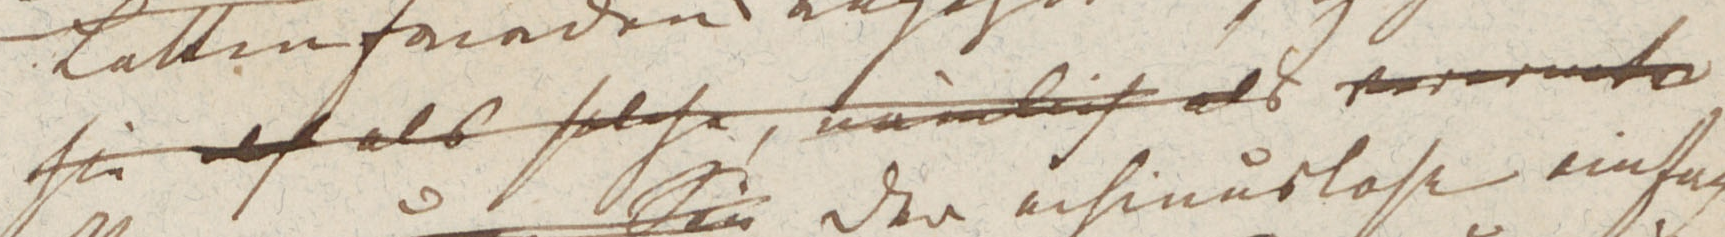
sie als als solche, nämlich als verarmte
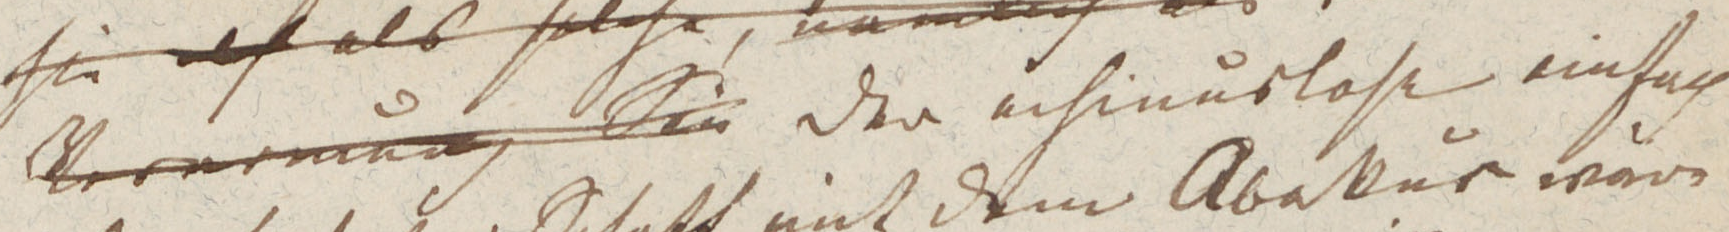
Verarmung Sie Der echinuslose einfach
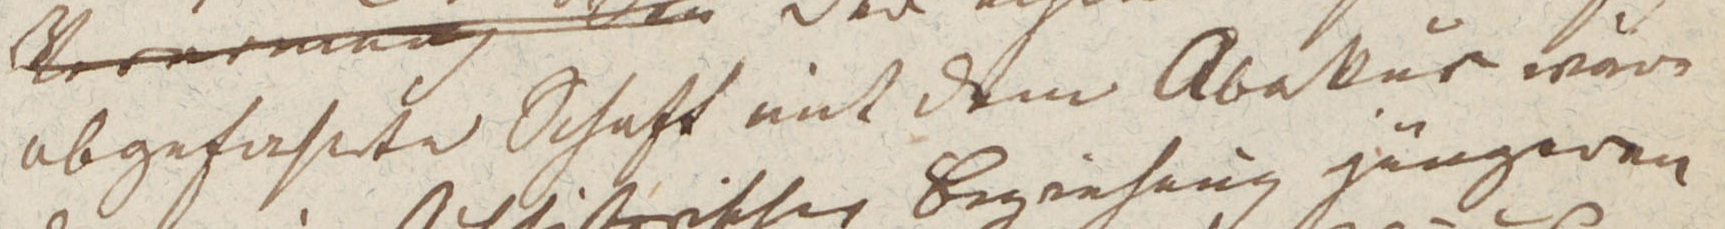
abgefasete Schaft mit dem Abakus wäre
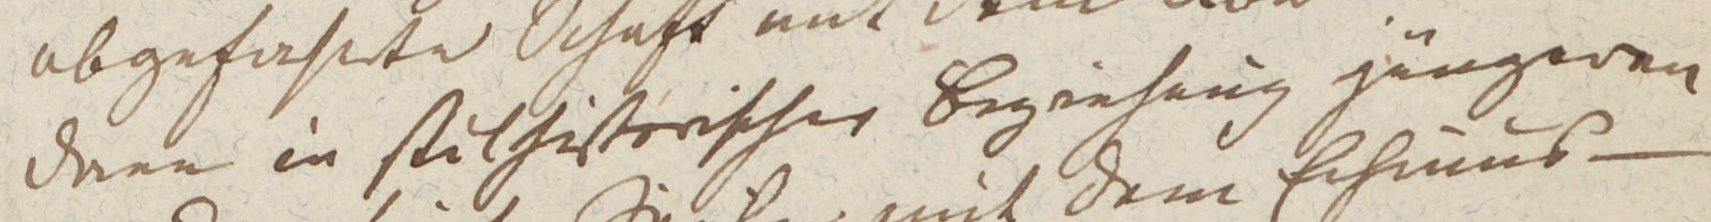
dann in stilhistorischer Beziehung jüngeren
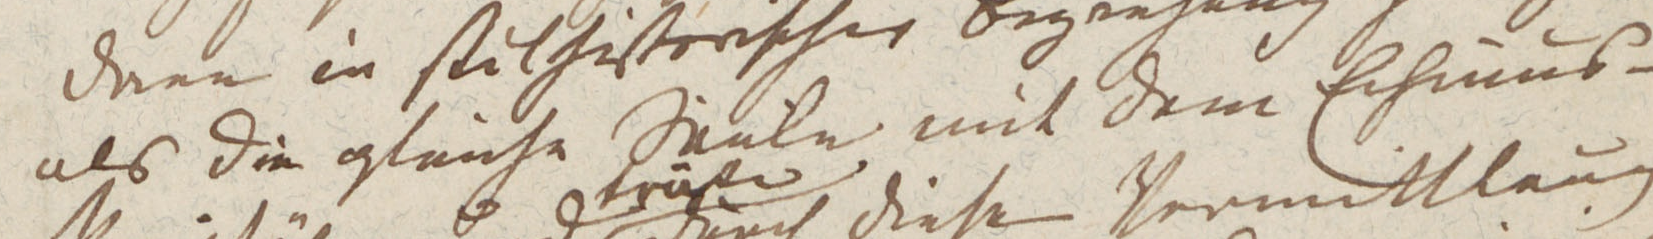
als die gleiche Säule mit dem Echinus-
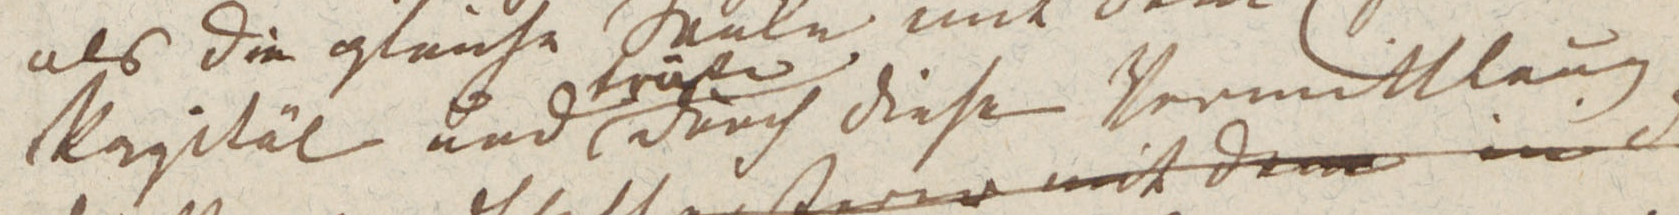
kapitäl und träte durch diese Vermittlung
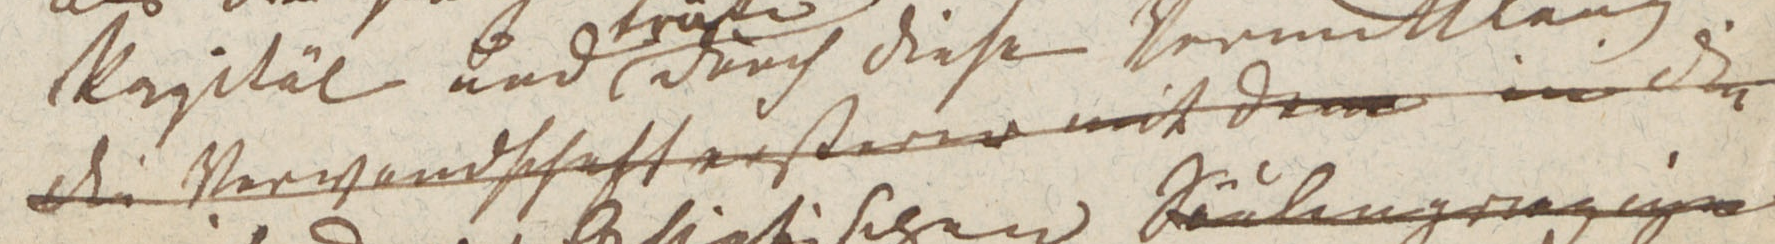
die Verwandschaft ersterer mit dem in die
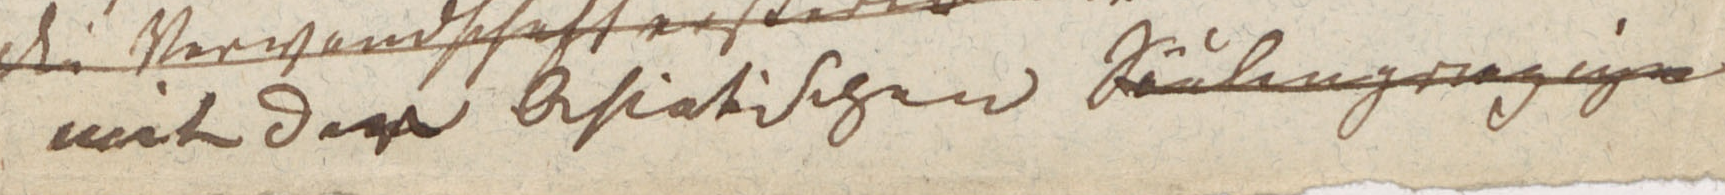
mit demr Asiatischen Säulenprinzipe
